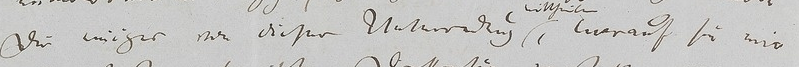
Dir einiges von dieser Unterredung mittheilen, worauf sie mir
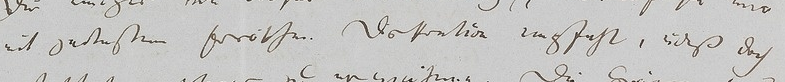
mit zartestem Erröthen Diskretion empfahl, indeß doch
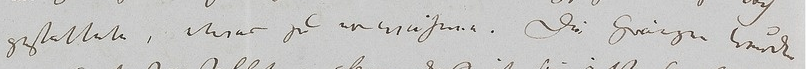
gestattete, etwas zu erwähnen. Die Gränzen wurden
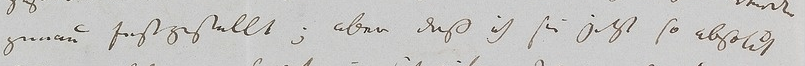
genau festgestellt; aber daß ich sie jetzt so absolut
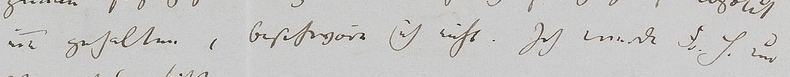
inne gehalten, beschwöre ich nicht. Ich werde Fr. H. um
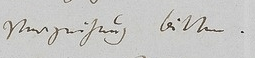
Verzeihung bitten.
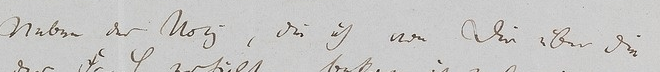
Neben der Notiz, die ich von Dir über die
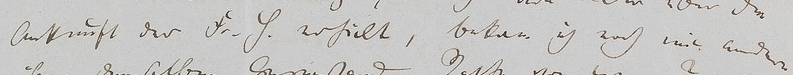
Ankunft der Fr. H. erhielt, bekam ich noch eine andere
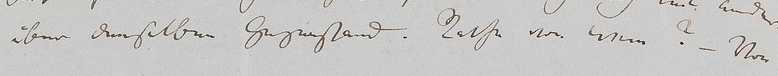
über denselben Gegenstand. Rathe von wem? – Von
